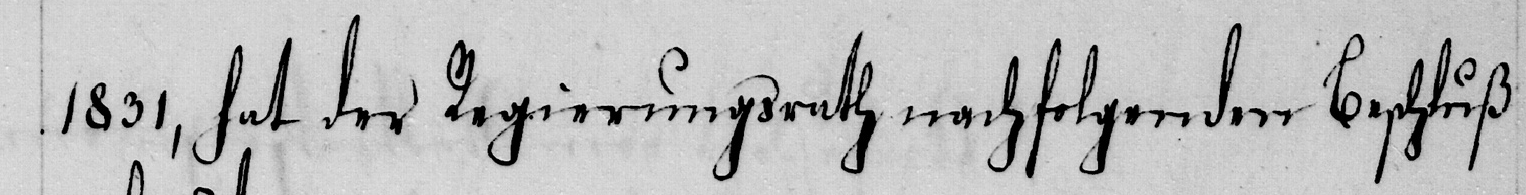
1831, hat der Regierungsrath nachfolgenden Beschluß
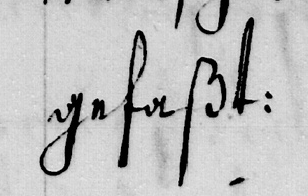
gefaßt:
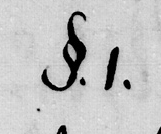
§. 1.
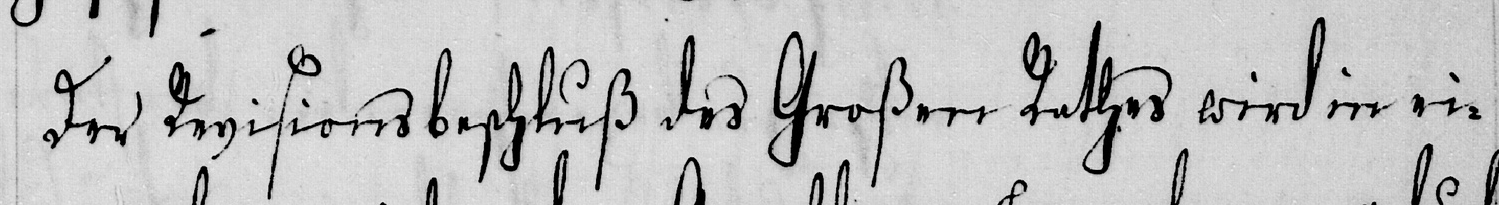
Der Revisionsbeschluß des Großen Rathes wird in ei¬
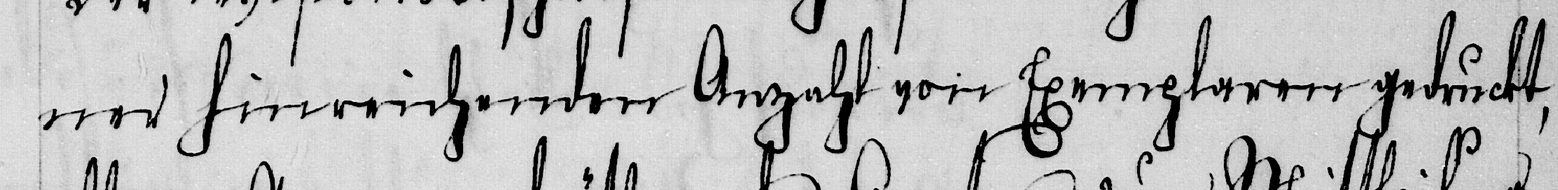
ner hinreichenden Anzahl von Exemplaren gedruckt,
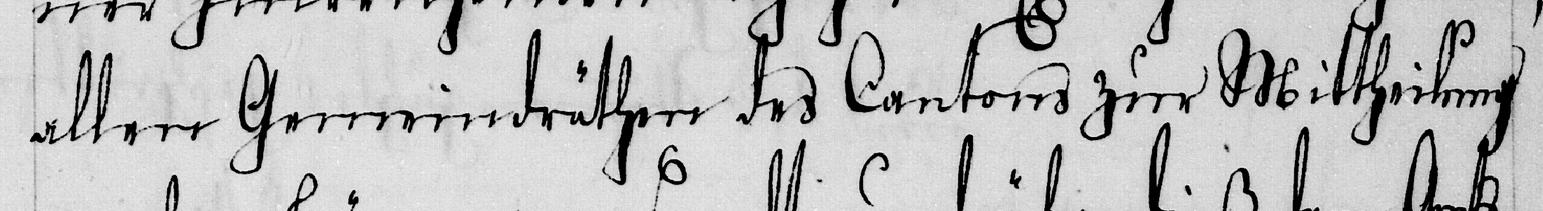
allen Gemeindräthen des Cantons zur Mittheilung
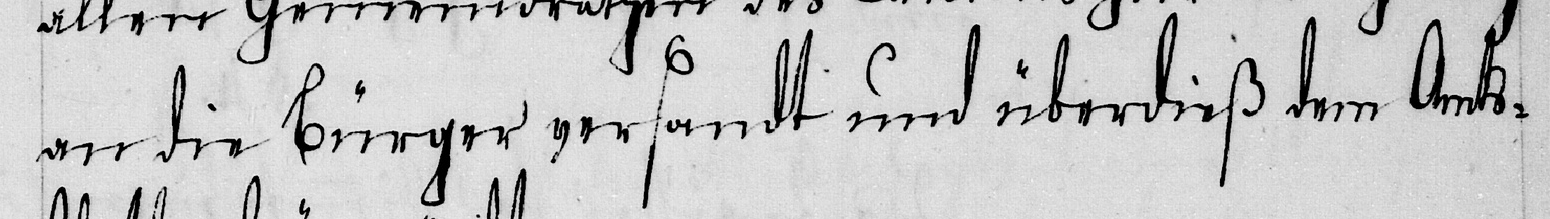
an die Bürger versandt und überdieß dem Amts¬
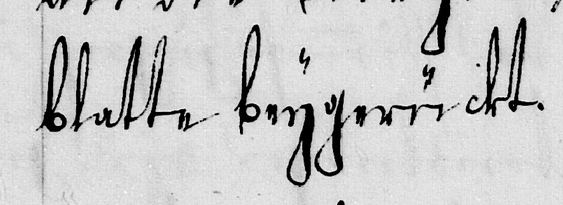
blatte beygerückt.
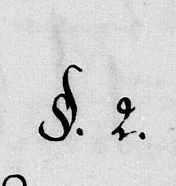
§. 2.
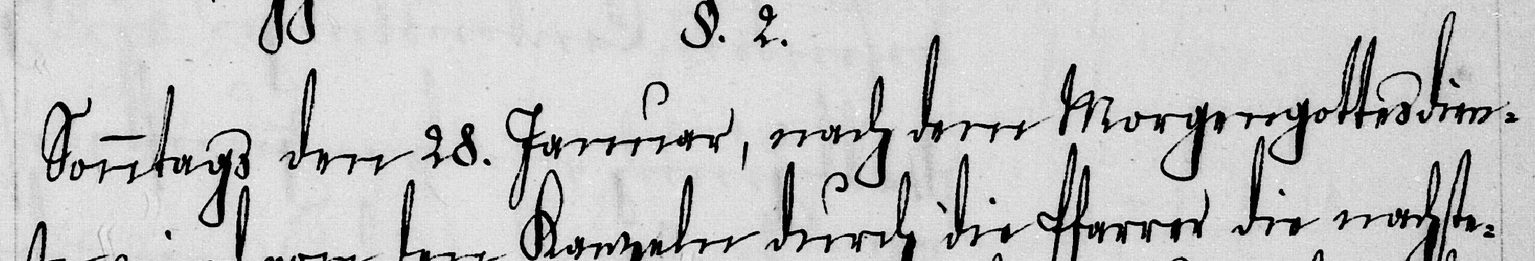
Sonntags den 28. Januar, nach dem Morgengottesdien¬
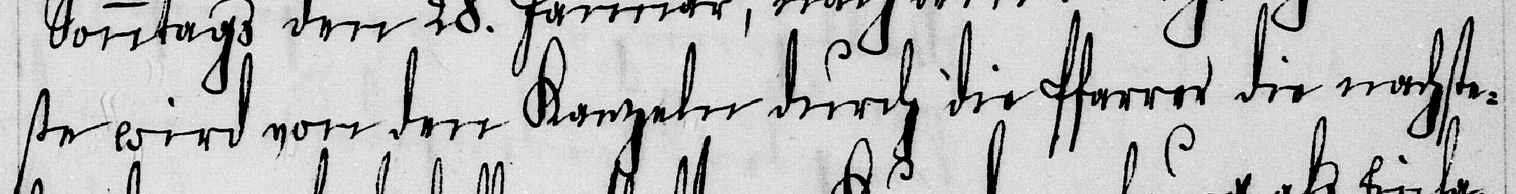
ste wird von den Kanzeln durch die Pfarrer die nachste¬
